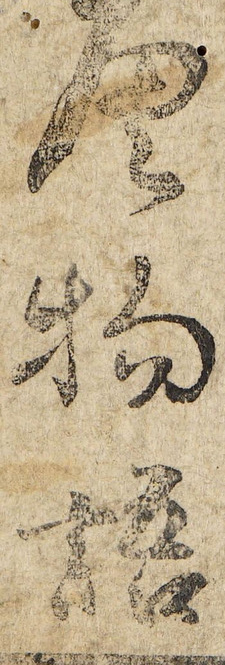唐物語

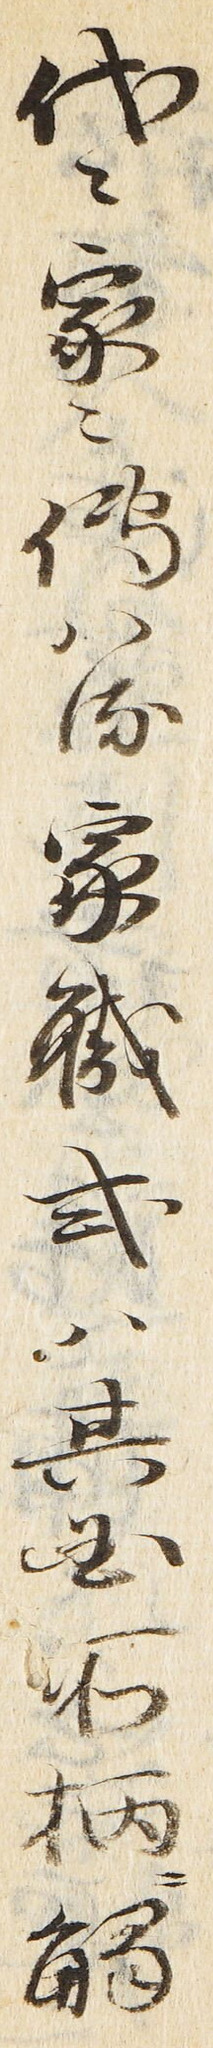代々家に伝はる家職或は其国所柄触
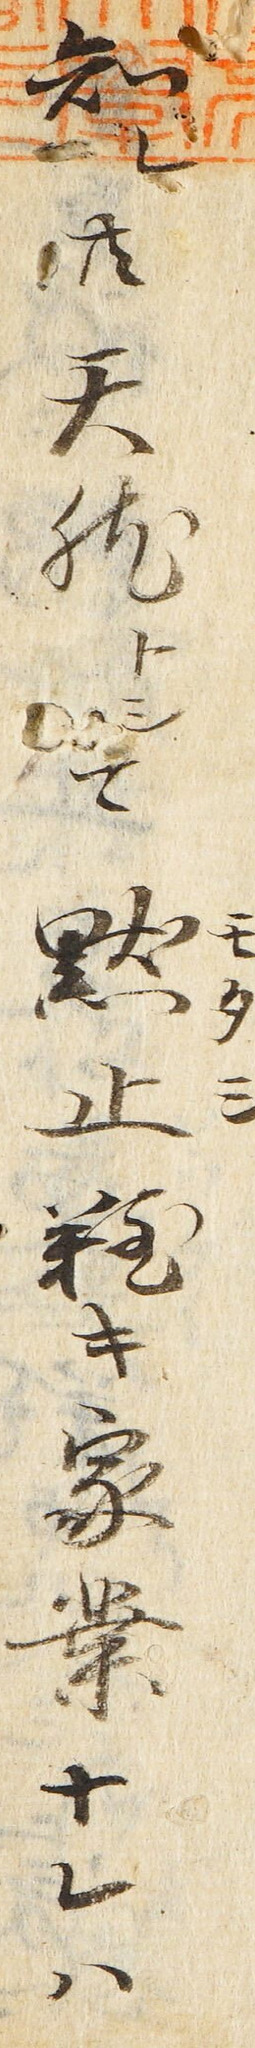知共天然て黙止難キ家業ナレハ

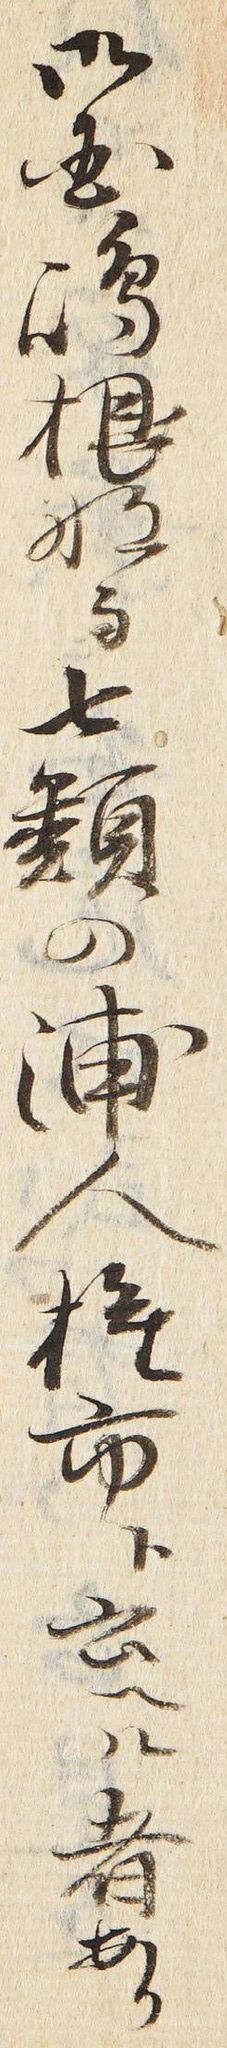御国島根なる七類の浦人権市云ヘル者あり
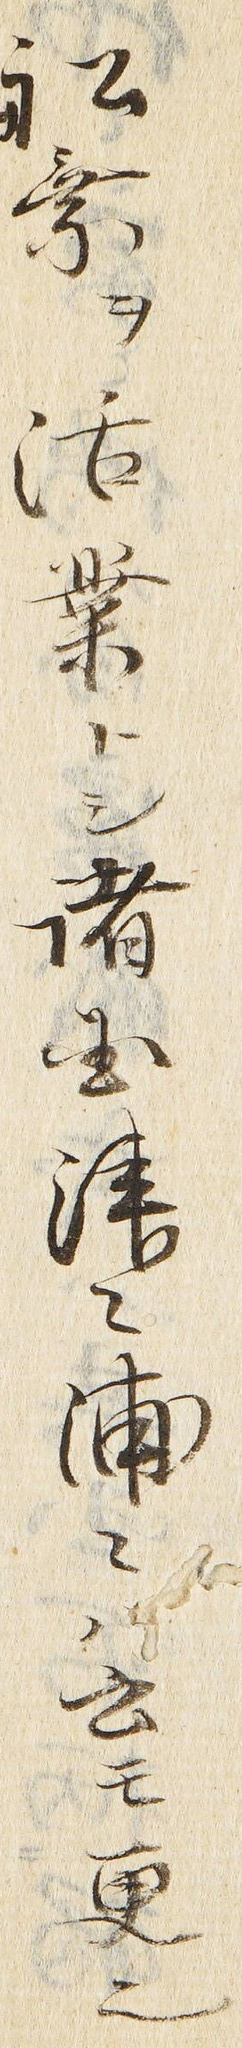船乗活業トシ諸国津々浦々ハ云モ更也
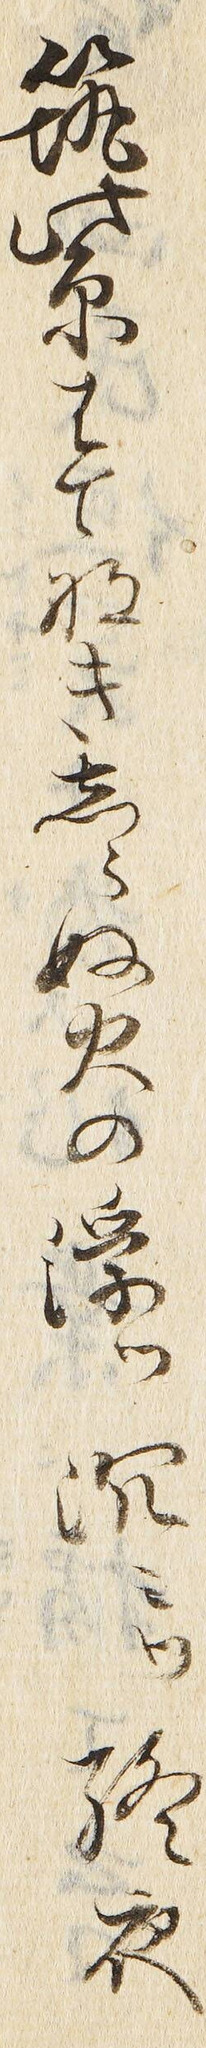筑紫はてなきしらぬ火の浮沈終夜
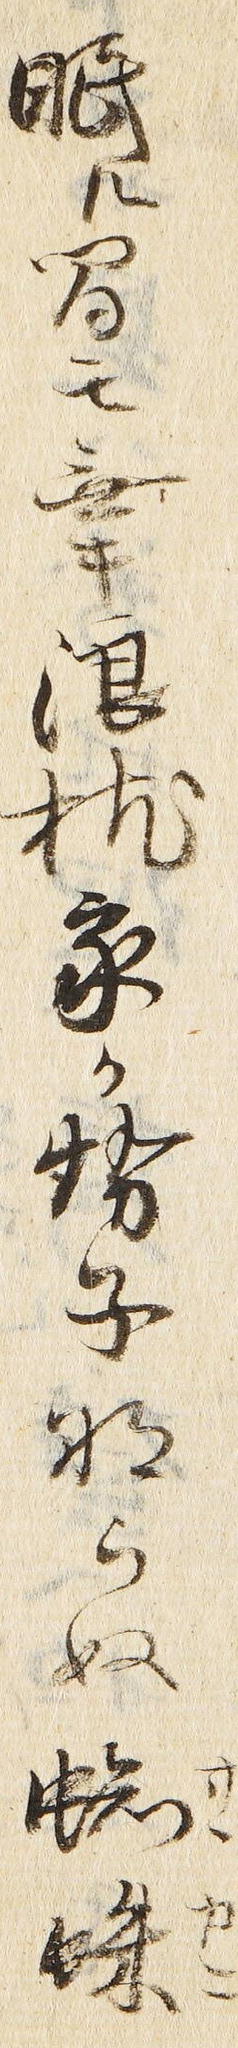眠ル間モ無キ浪枕か勢子ならぬ蜘蛛
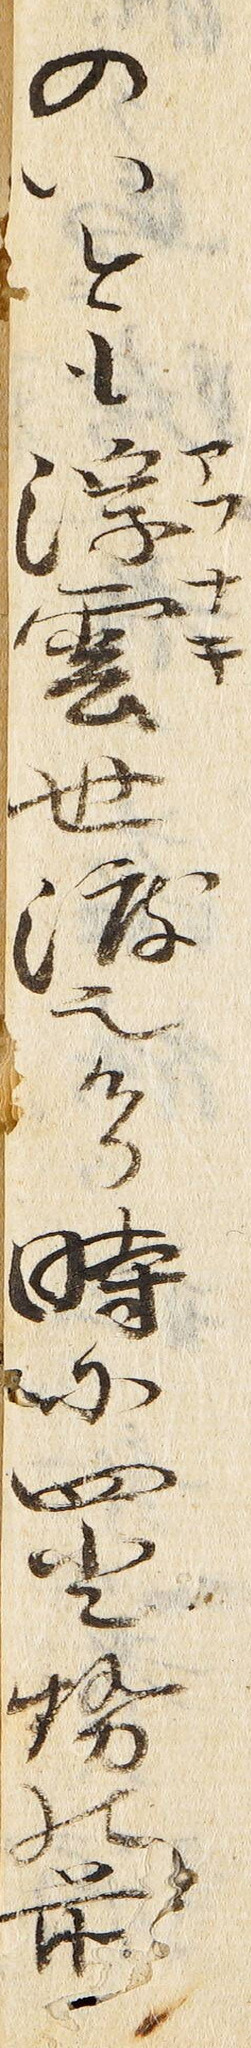のいとも浮雲世渡也けり時に四とせの前
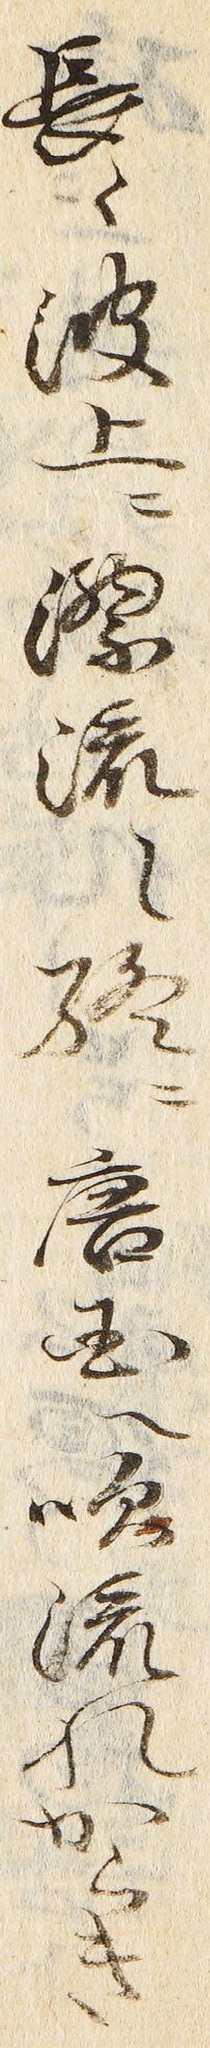長く波上漂流し終唐国へ流れからき
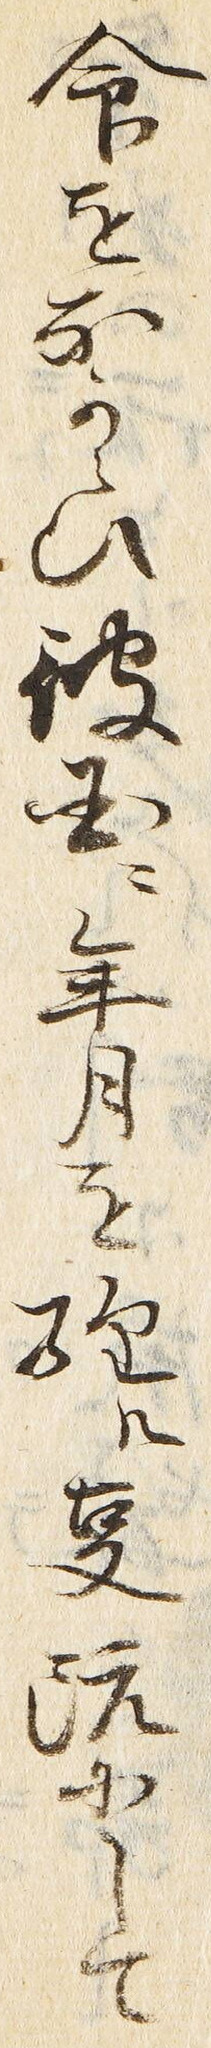命をなからひ彼国年月を経ル事既にして
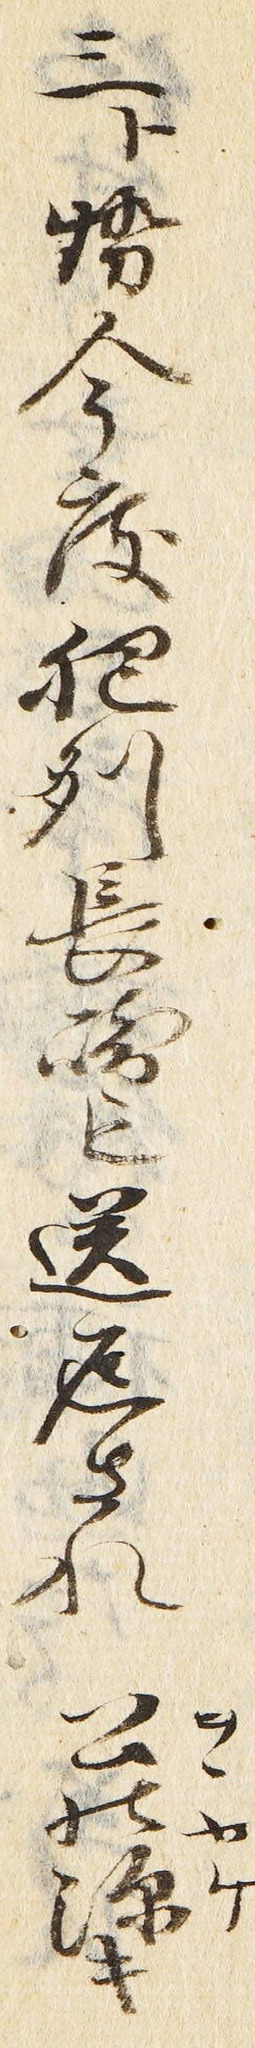三トせ今度肥州長崎迄送返され公の深キ
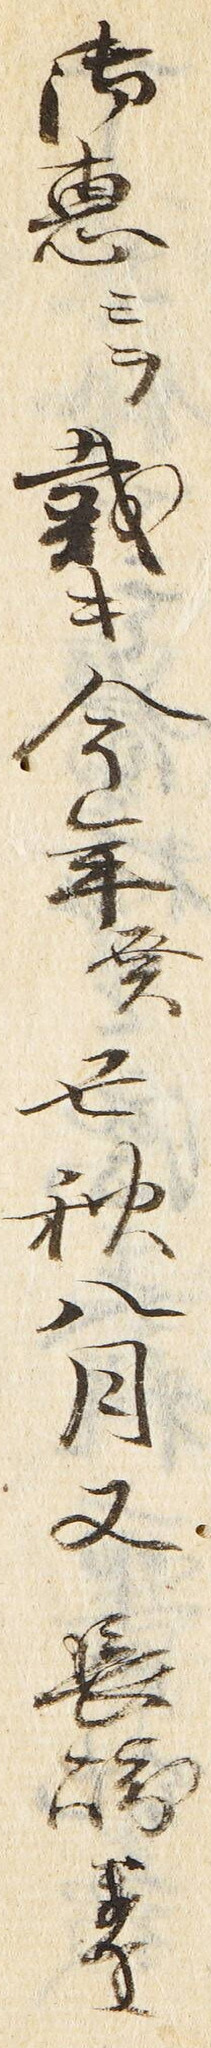御恵頂キ今年癸丑秋八月又長崎より
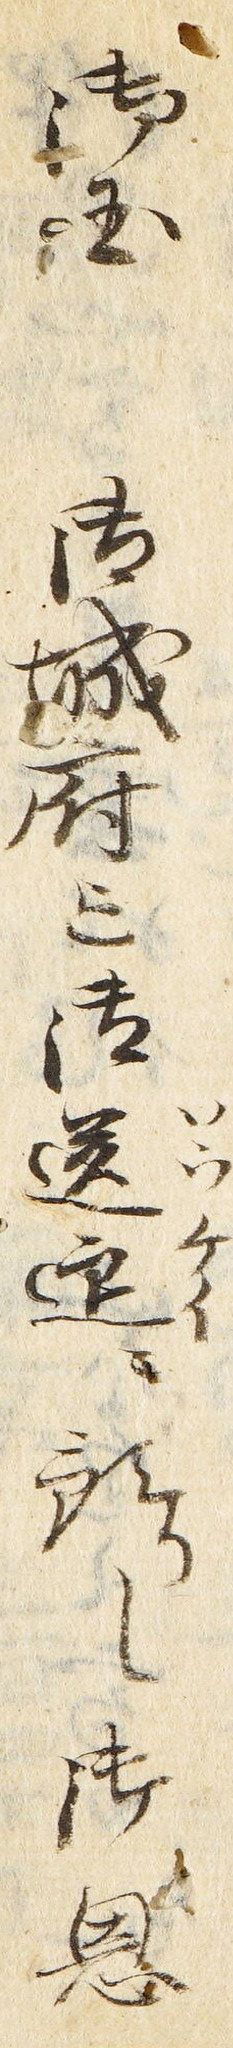御国御城府迄送迎預りし御恩

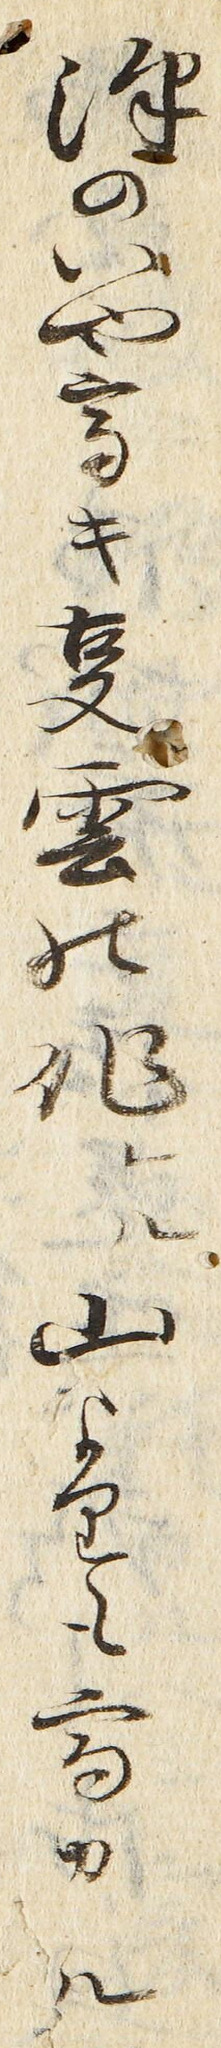沢のいや高キ事雲の作山よりも高かる
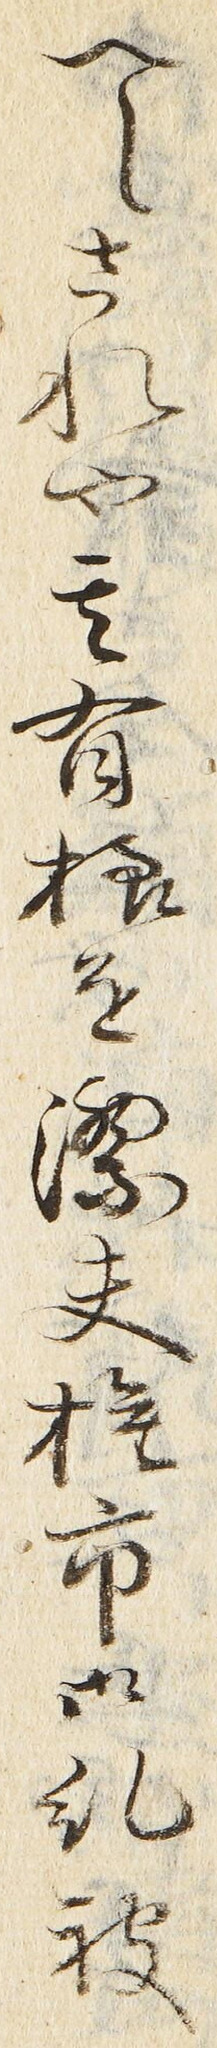へしされや其有様を漂夫権市御糺被
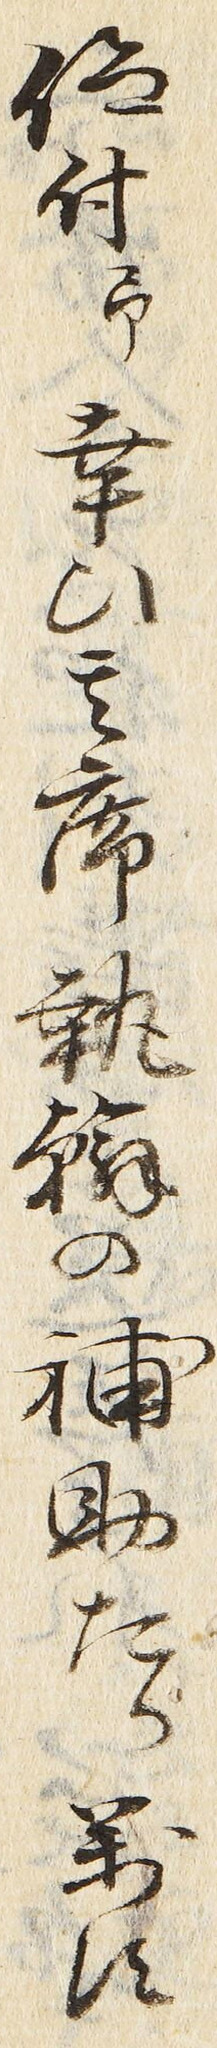仰付即幸ひ其席執翰の補助たり万す
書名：唐物語
